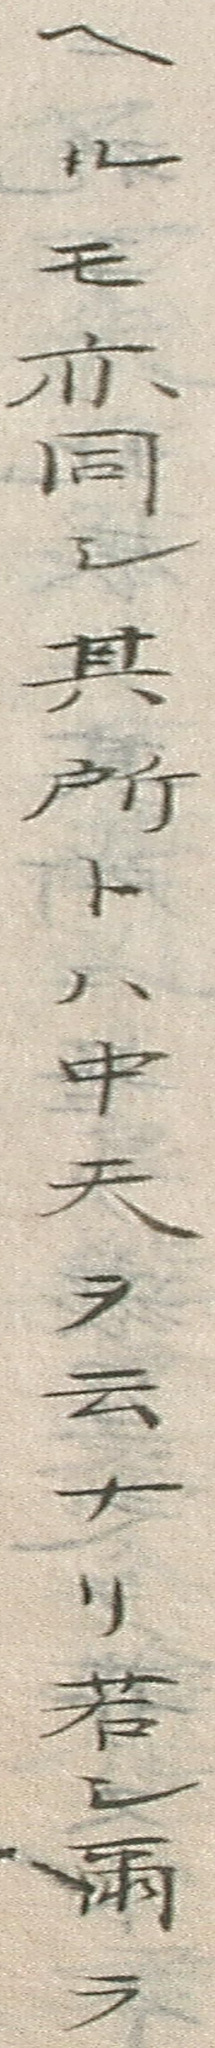ヘルモ亦同シ其所トハ中天ヲ云ナリ若シ爾ラ
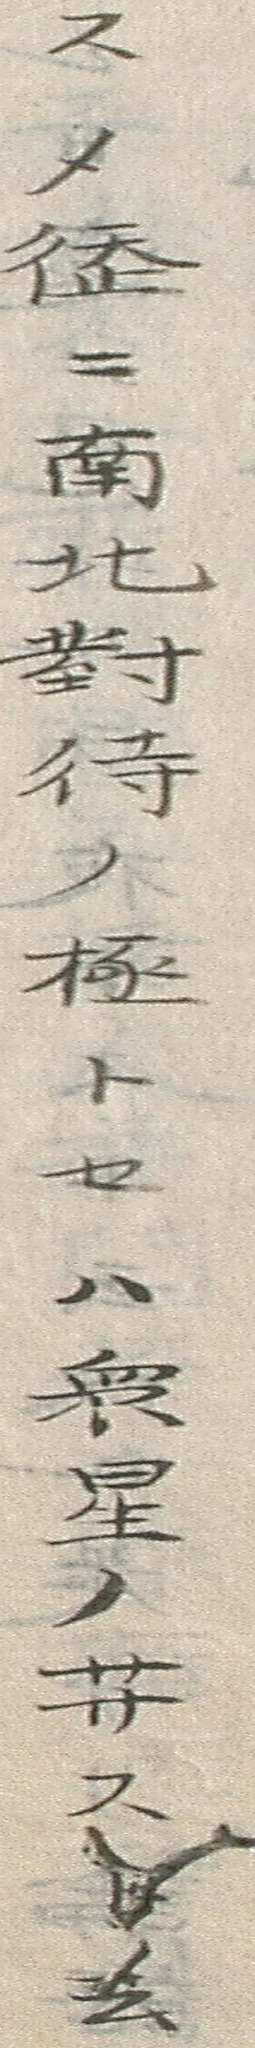スシテ𢔗ニ南北対峙ノ極トセハ衆星ノ共スト云
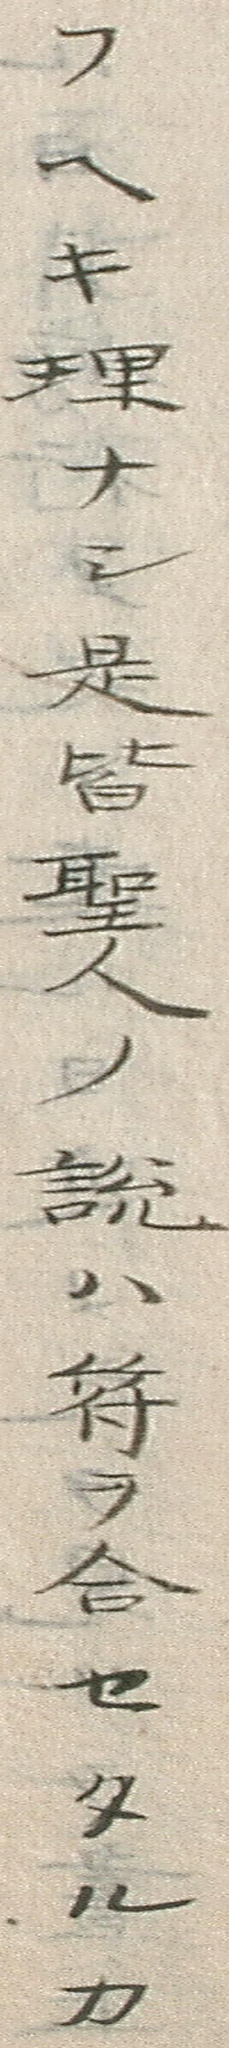フヘキ理ナシ是皆聖人ノ説ハ符ヲ合セタルカ
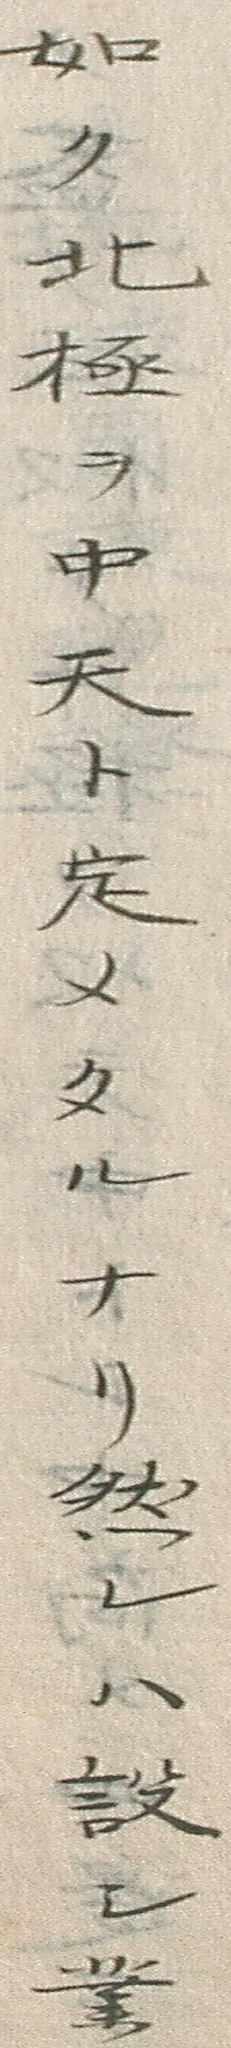如ク北極ヲ中天ト定メタルナリ然レハ設シ業
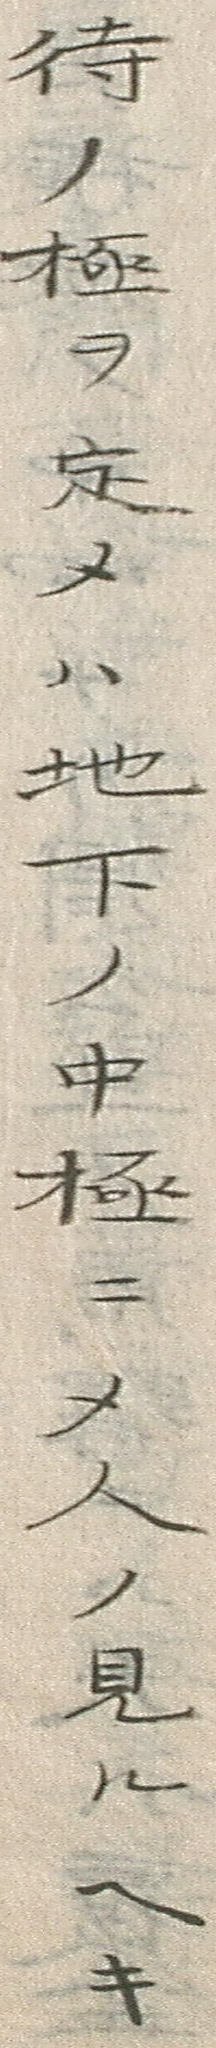待ノ極ヲ定メハ地下ノ中極ニシテ人ノ見ルヘキ
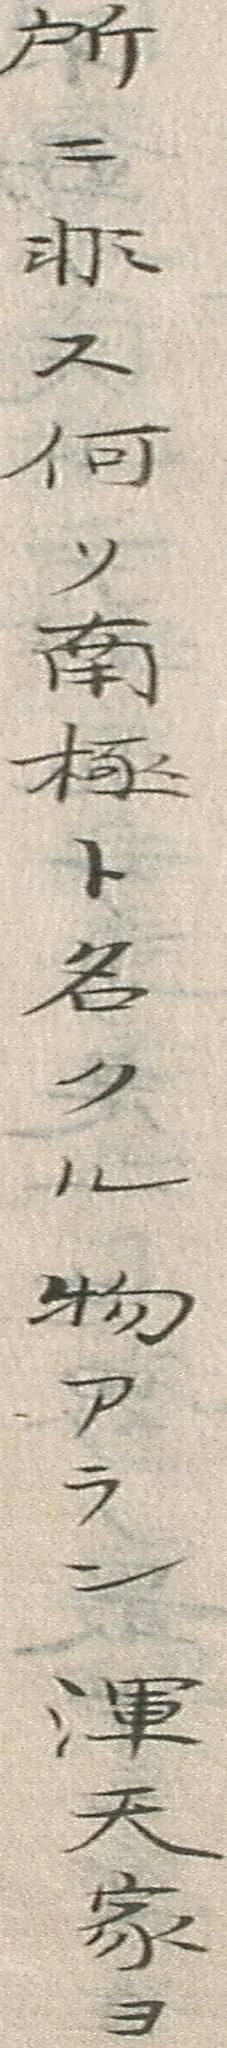所ニ非ス何ソ南極ト名クル物アラン渾天家ヨ
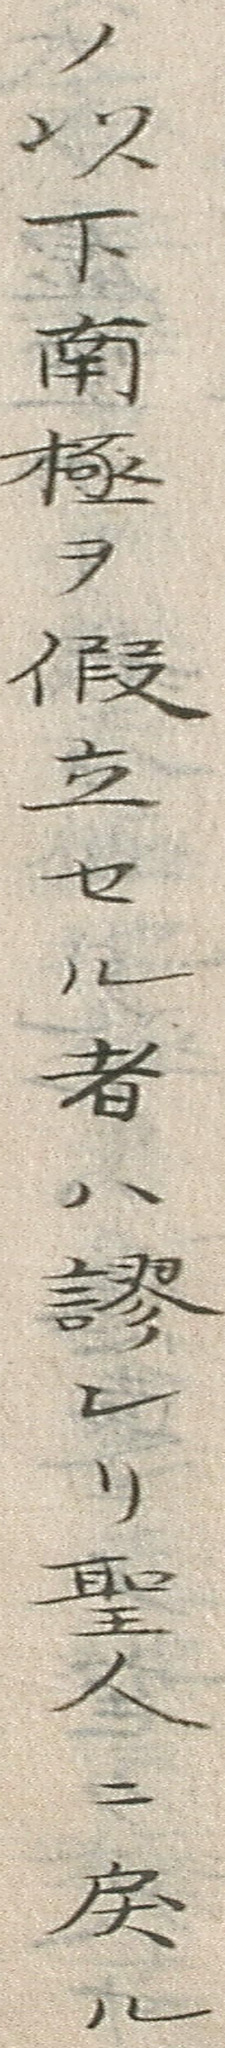ノ以下南極ヲ仮立セル者ハ謬レリ聖人ニ戻ル
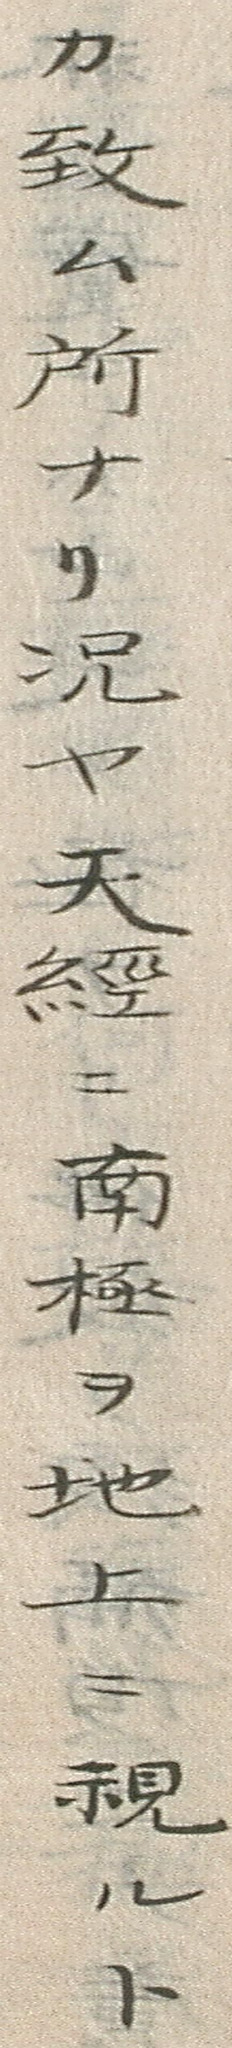カ致ム所ナリ況ヤ天経ニ南極ヲ地上ニ視ルト
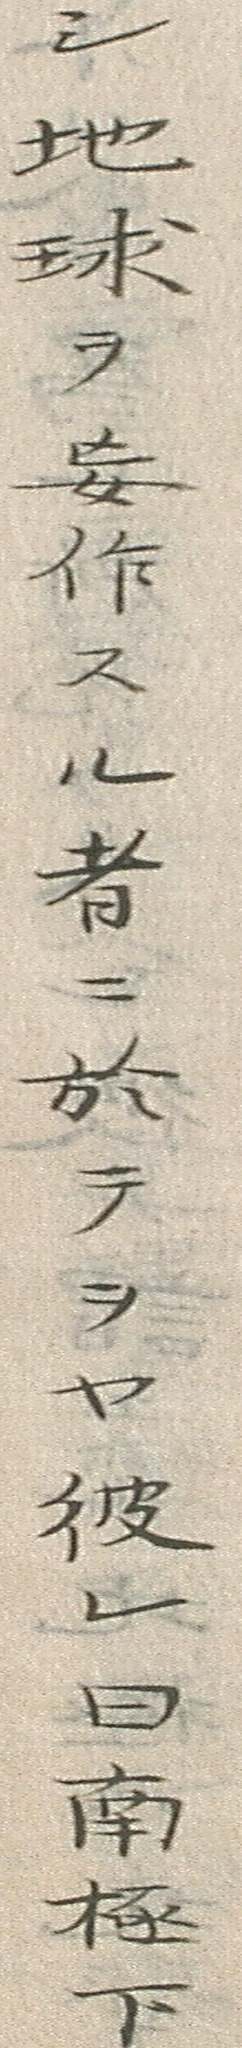シ地球ヲ妄作スル者ニ於テヲヤ彼レ曰南極下
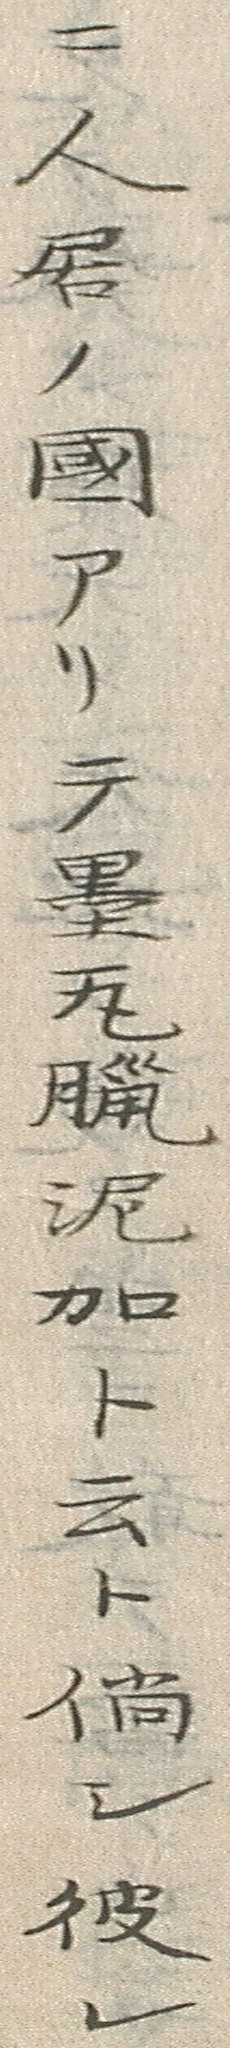ニ人居ノ国アリテ墨瓦臘泥加ト云ト倘シ彼レ
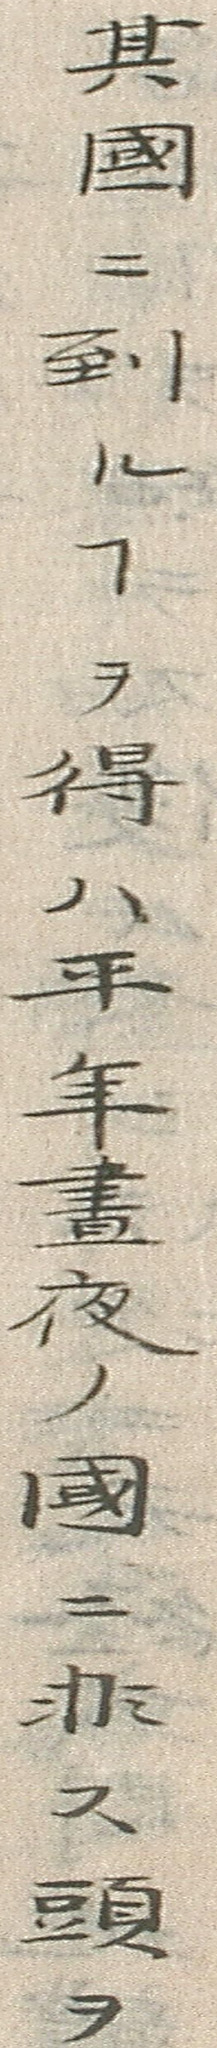其国ニ到ルコトヲ得ハ平年昼夜ノ国ニ非ス頭ヲ
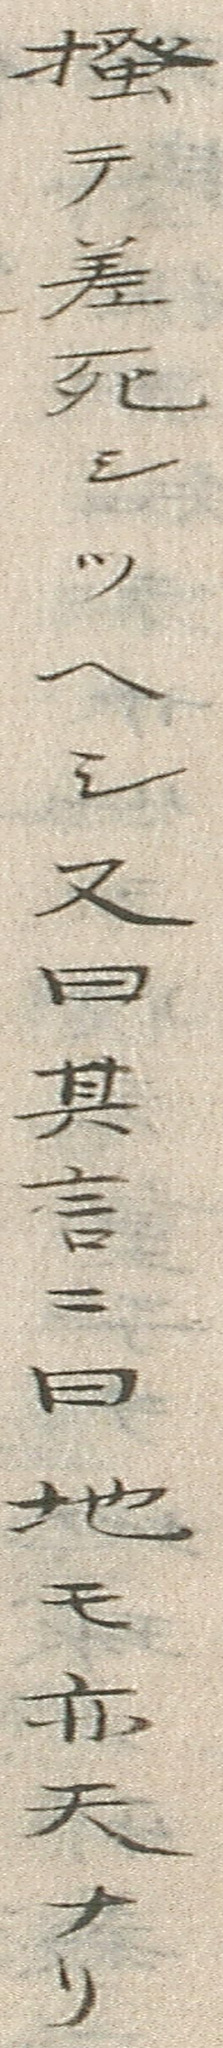揆テ差死シッヘシ又曰其言ニ曰地モ亦天ナリ
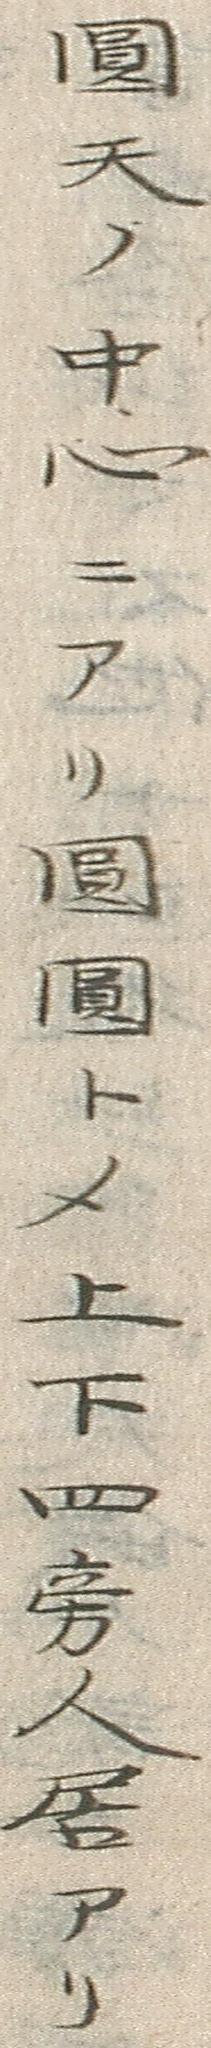円天ノ中心ニアリ円円トシテ上下四旁人居アリ
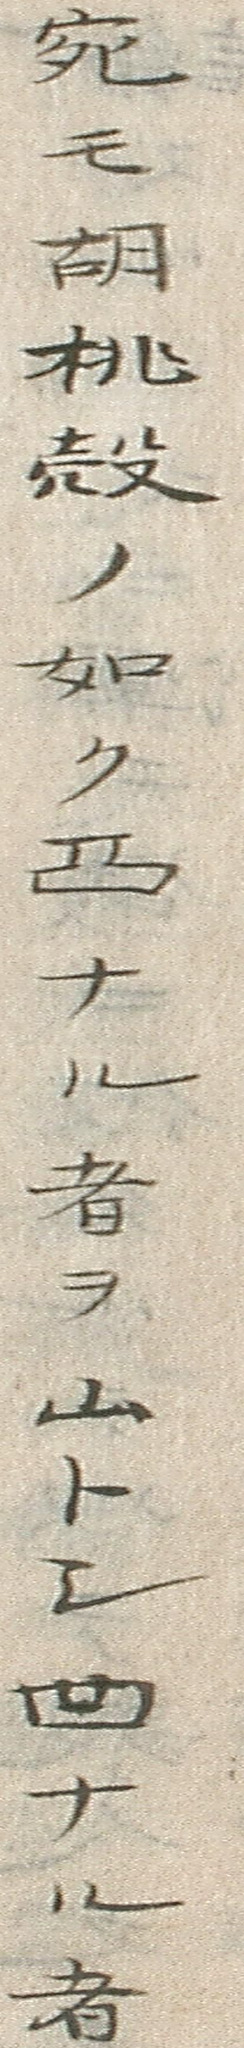宛モ胡桃穀ノ如ク凸ナル者ヲ山トシ凹ナル者
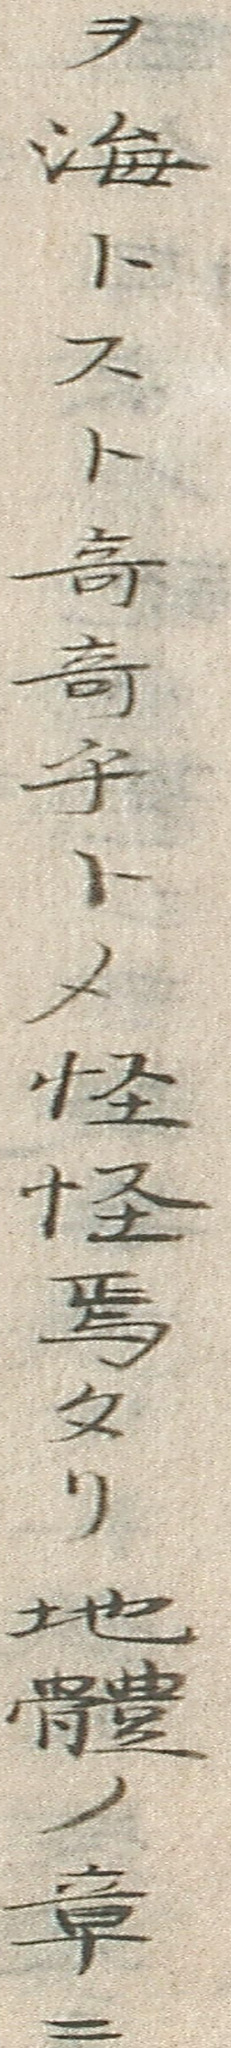ヲ海トスト奇奇乎トシテ怪怪焉タリ地体ノ章ニ
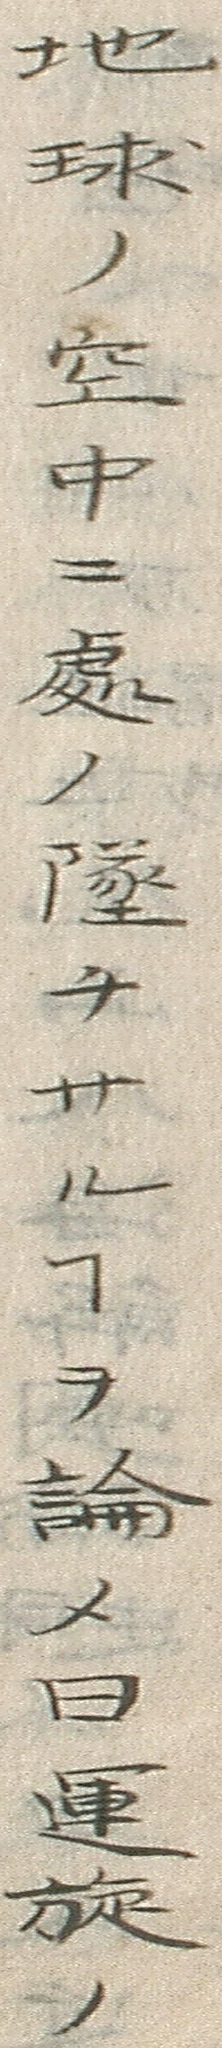地球ノ空中ニ処ノ墜チサルコトヲ論シテ曰運旋ノ
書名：天學略名目羽翼　全
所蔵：東京大学地震研究所図書室 Earthquake Research Institute Library, The University of Tokyo, JAPAN
